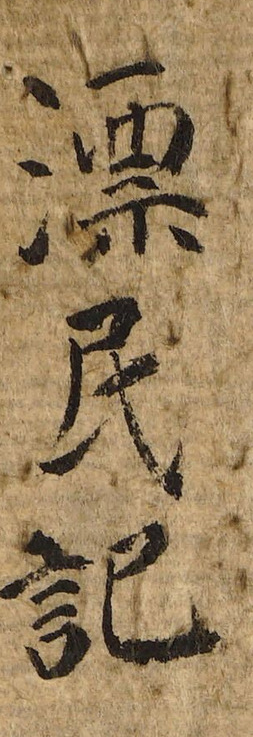漂民記

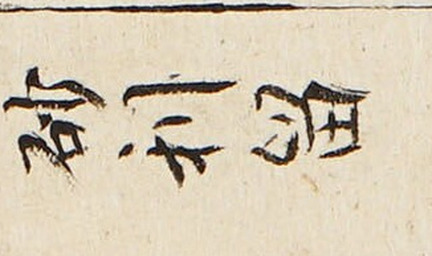砂利留

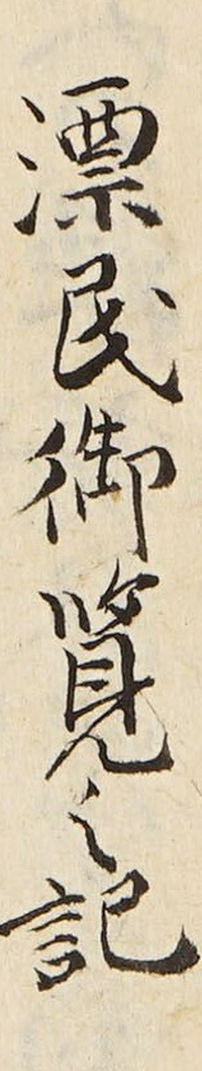漂民御覧之記
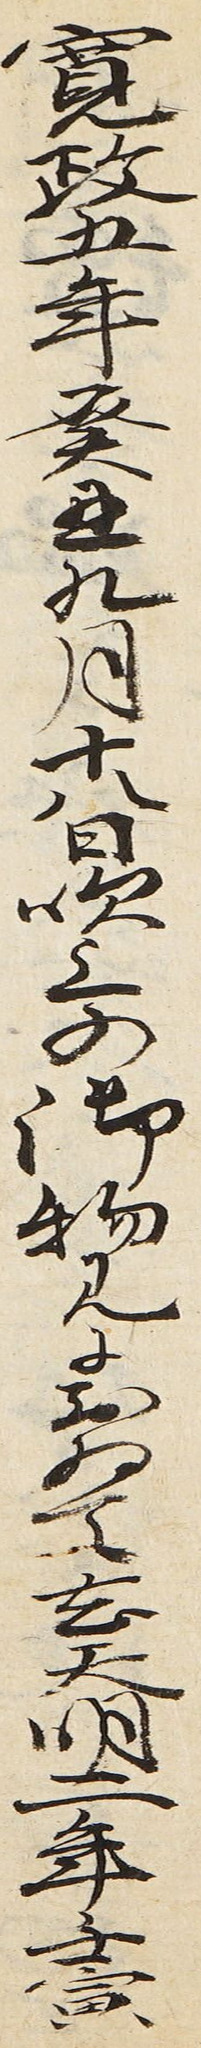寛政五年癸丑九月十八日吹上の御物見におゐて去天明二年壬寅
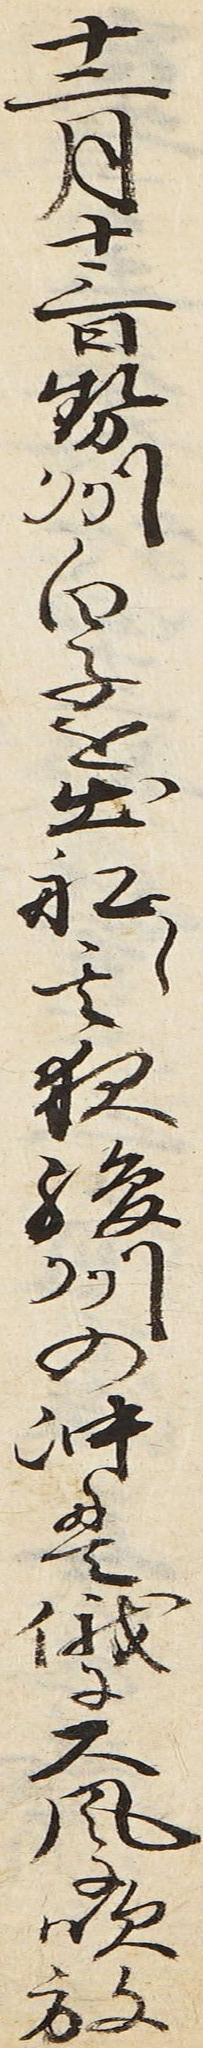十二月十三日㔟州白子を出舩し其夜駿州の沖にて俄に大風に吹放
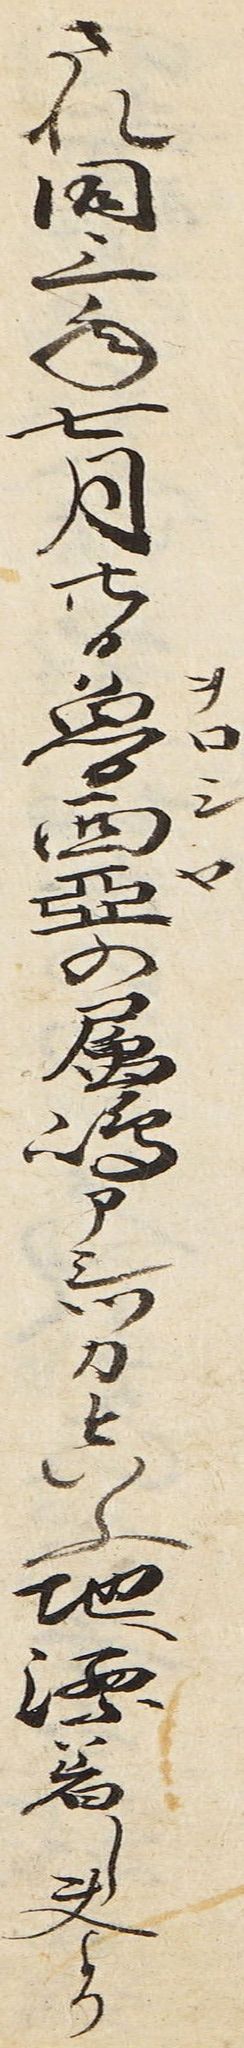され同三年七月廿日魯西亜の属嶋アシツカといふ地へ漂着し夫より
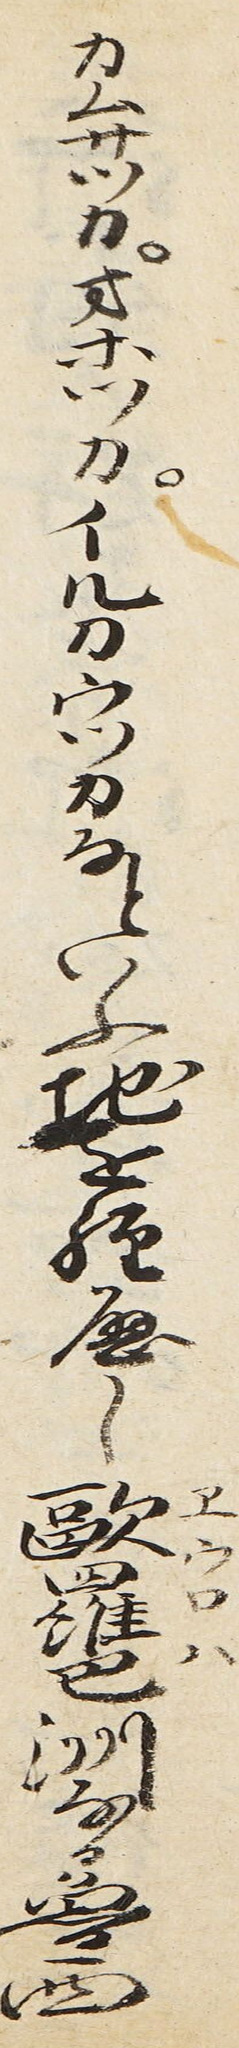カムサツカ。オホツカ。イルカウツカなといふ地を経へし歐羅巴洲なる魯西
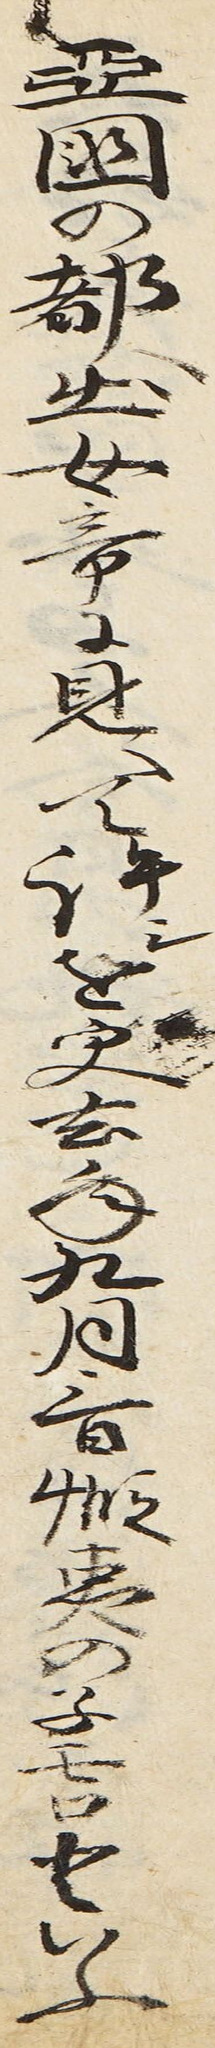亜国の都へ出女帝に見へて許シを受去年九月三日蝦夷のネモロといふ
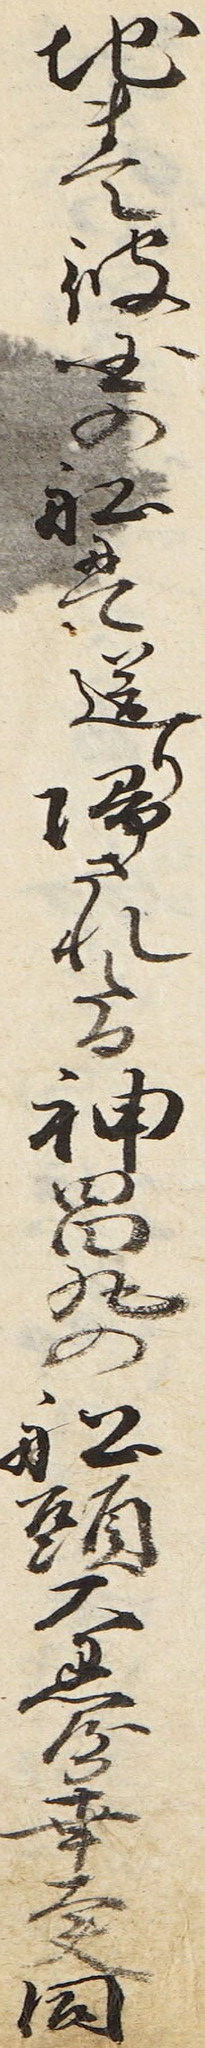地まて彼國の舩にて送り帰されたる神昌丸の舩頭大黒屋幸太夫同
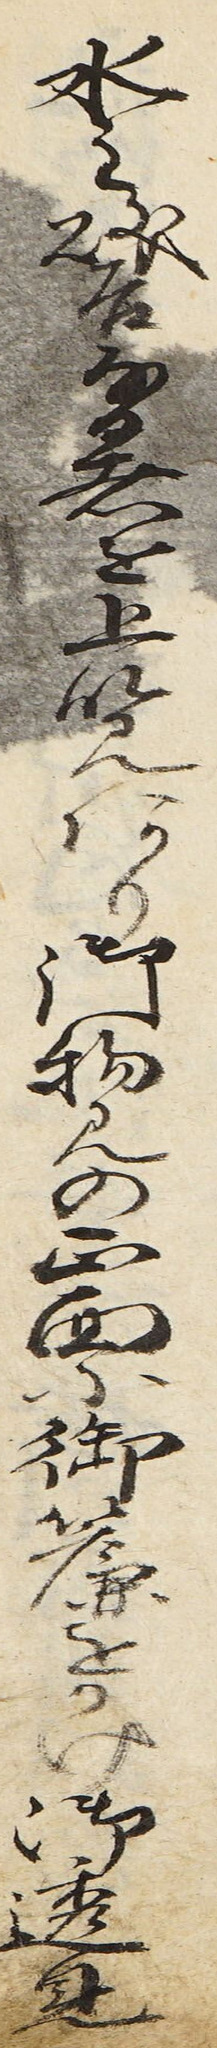水主磯吉なる者を上覧あり御物見の正面に御簾をかけ御透見
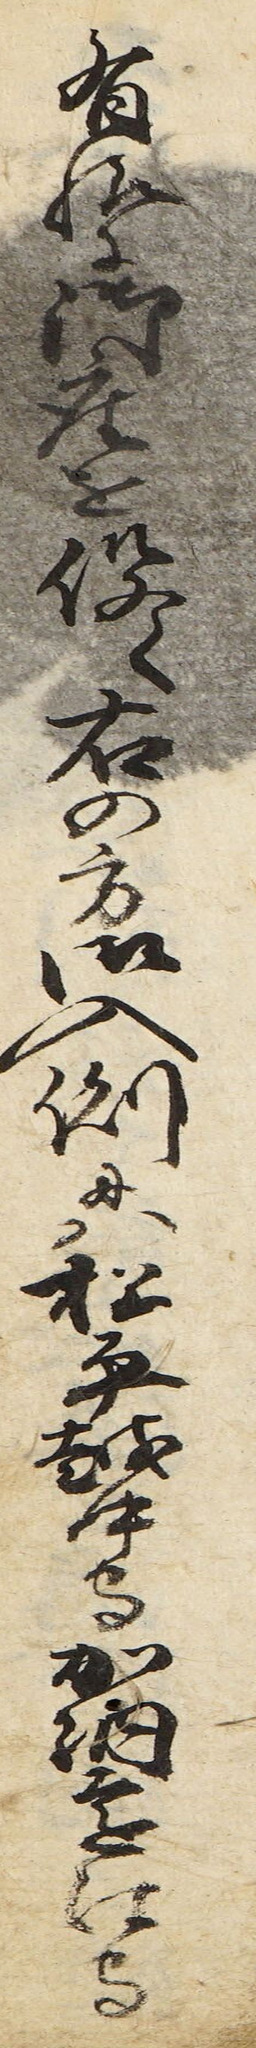有様に御座を役へ右の方御入側には松平越中守加納遠江守

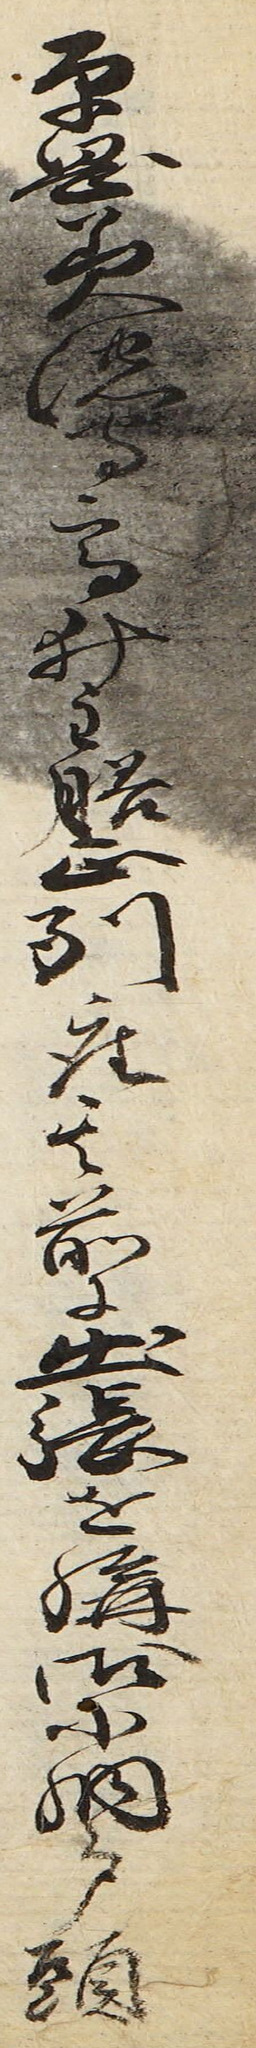平岡美濃守高井主膳正列座其前に出張を構へ御小納戸頭
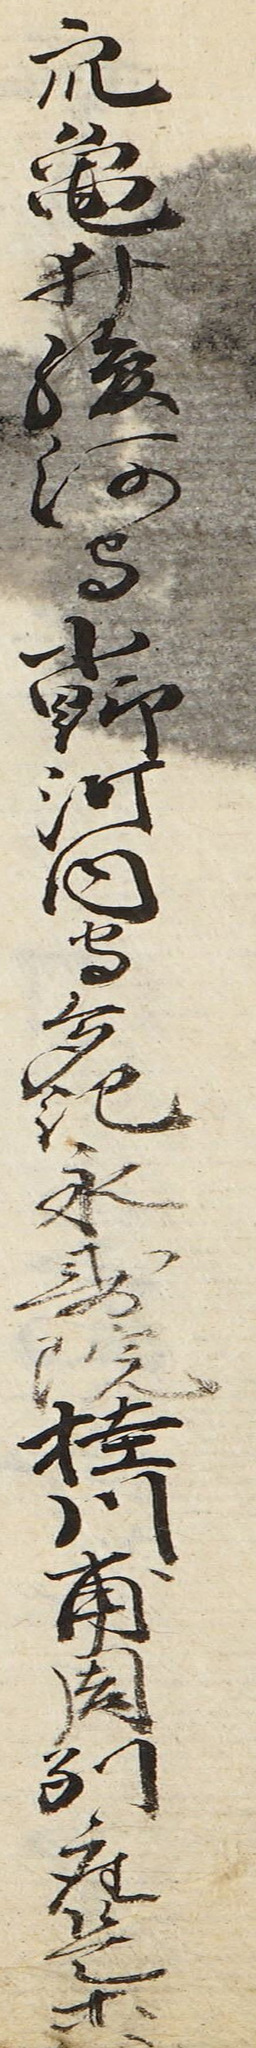衆亀井駿河守小野河内守多紀永寿院桂川甫周列座是等は
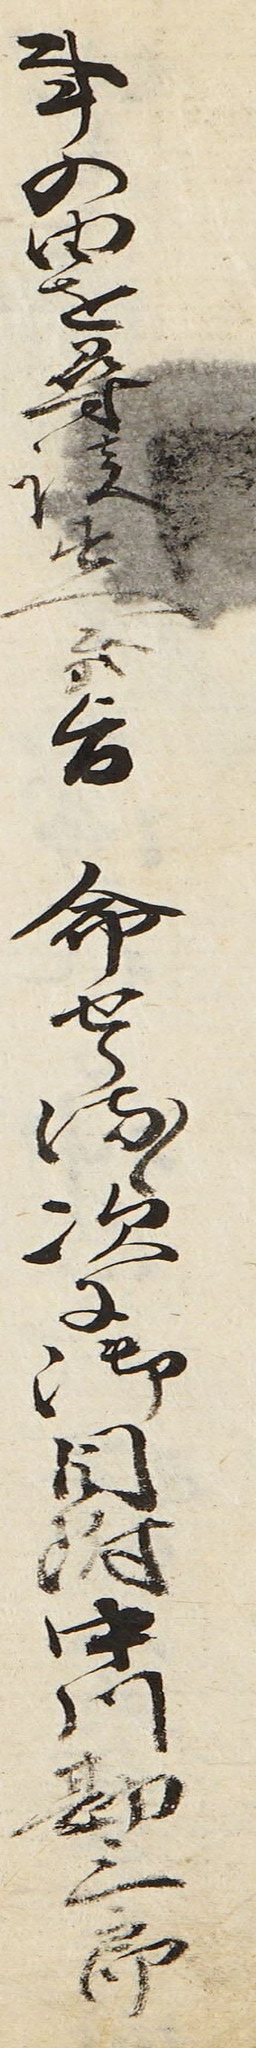事の由を尋談すへき旨命せらるゝ次に御目附中川勘三郎
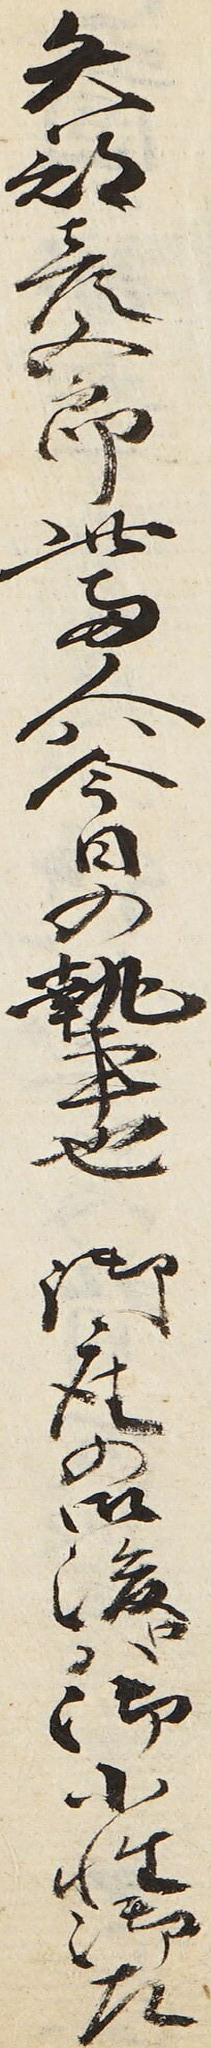矢部彦五郎此両人は今日の執事也御座の御後えは御小性御左
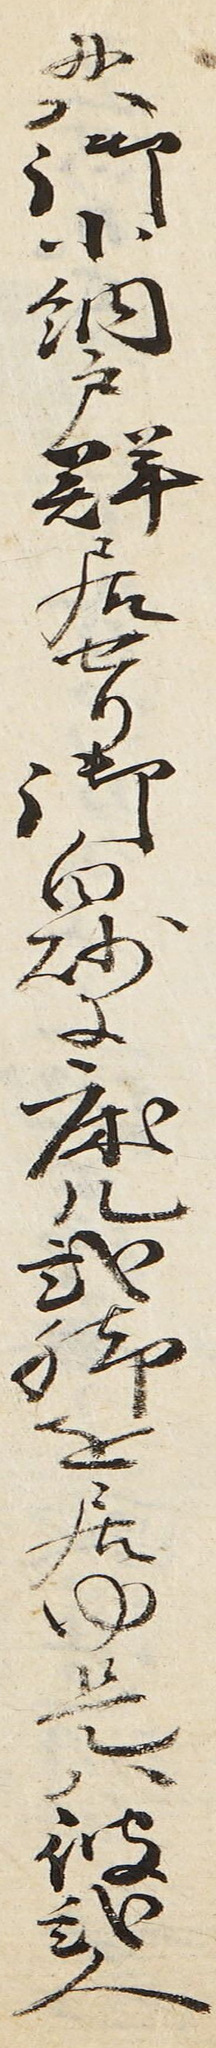には御小納戸群居せり御白砂に床几弐脚を居ゆ是は彼弐人
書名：漂民御覧之記
